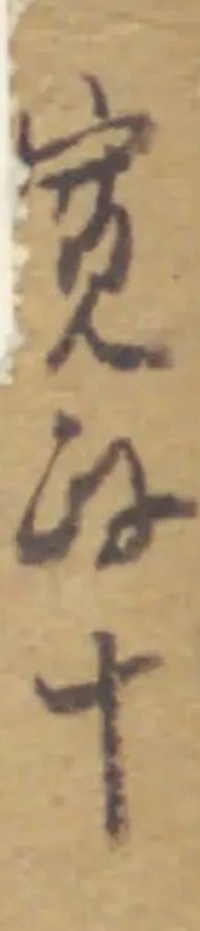寛政十

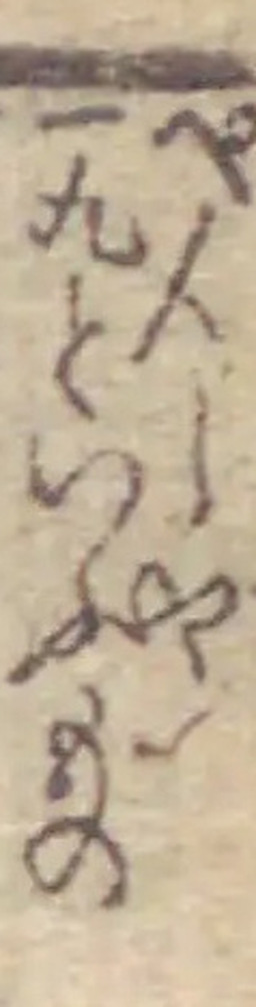一九といふもの
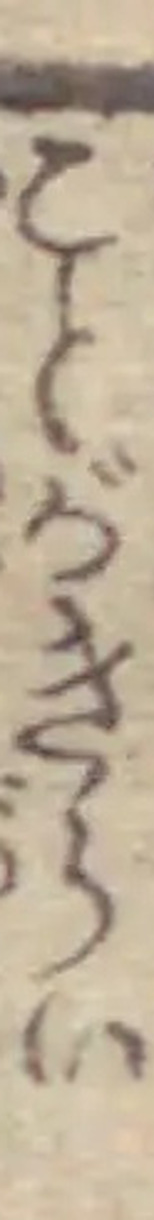ことがきらい
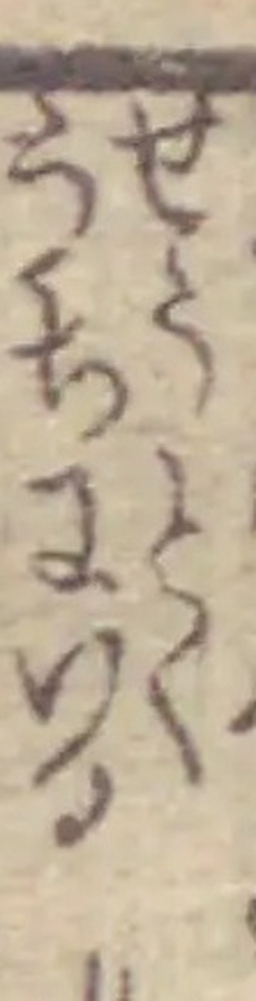うちにいる
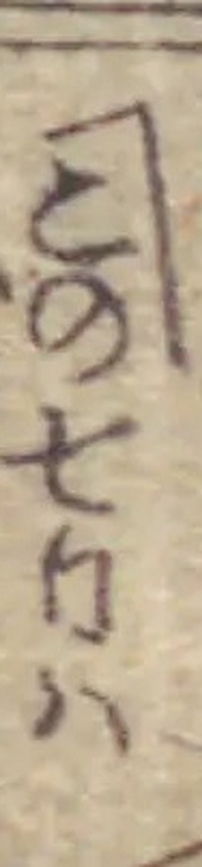〽この七日は
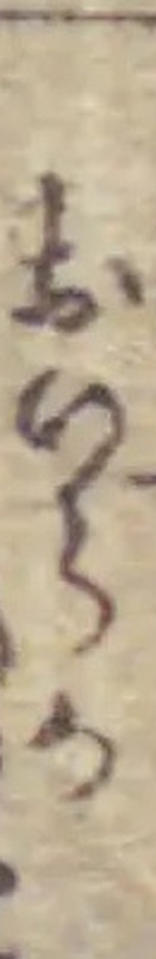おいらか
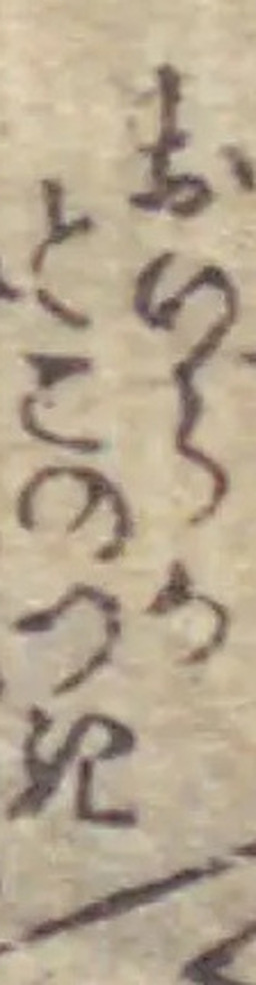とこのつき
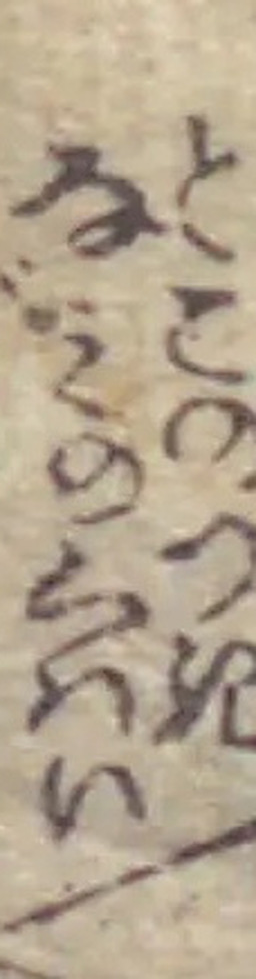なみのくはい
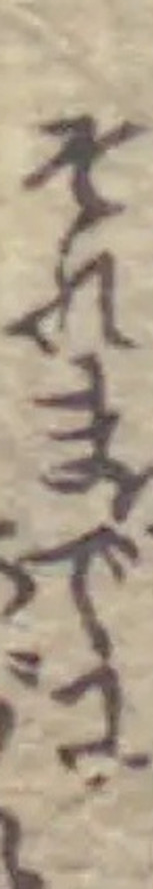それまでに
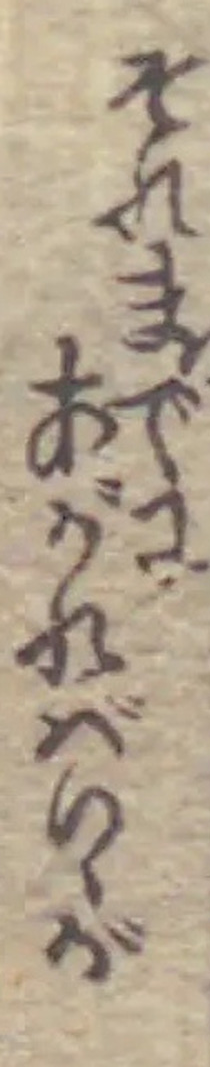あがればいゝが
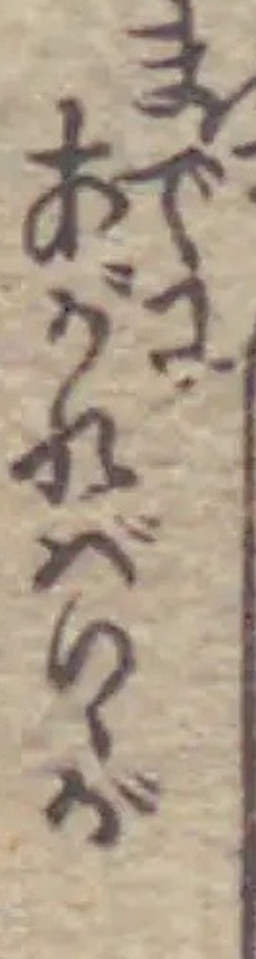あがればいゝが
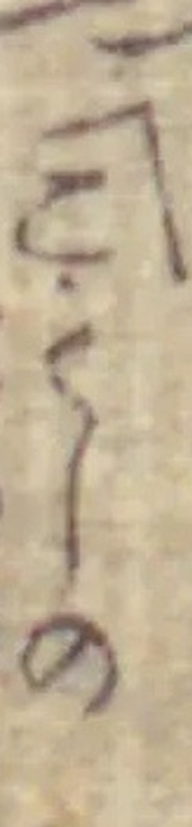〽ことしの
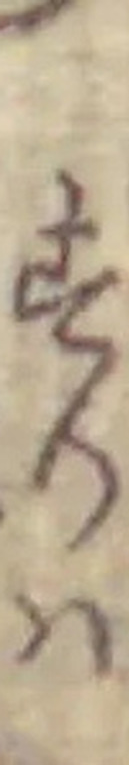すりは
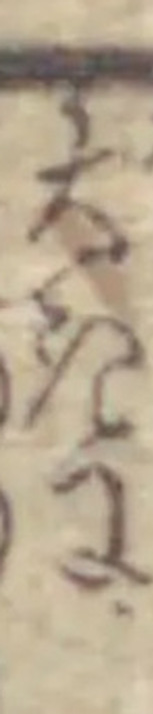大きに
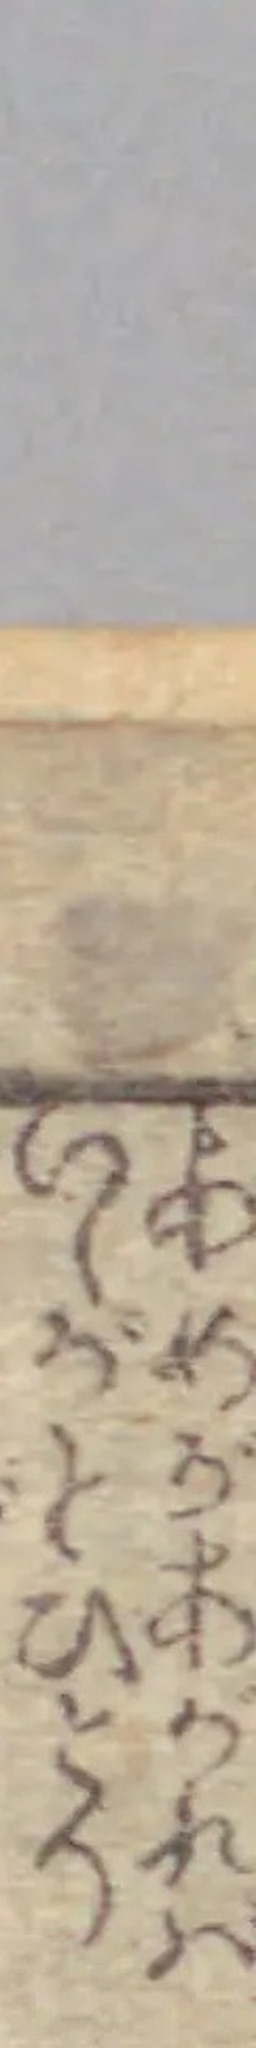いゝがとひとり

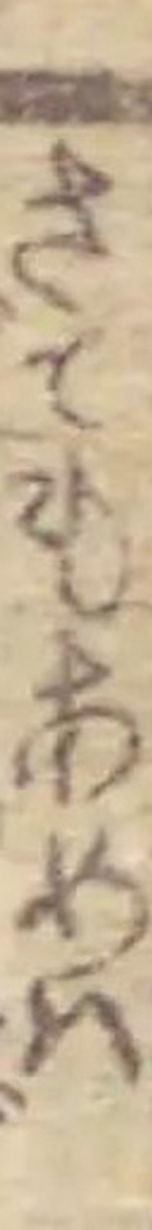さてもあめは
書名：雨宮風宮出儘略縁記 3巻
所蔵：国立国会図書館 National Diet Library, JAPAN
